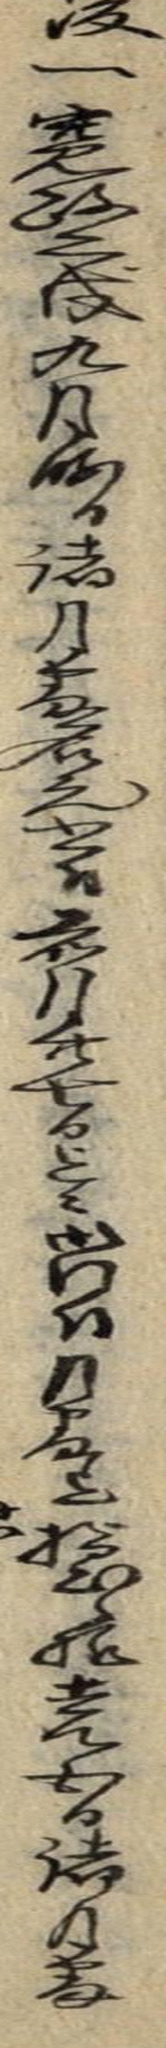後一寛政二戌九月晦日諸月番名元書付前月廿七日迄に御目付月番迄指出候様去る五日諸月番
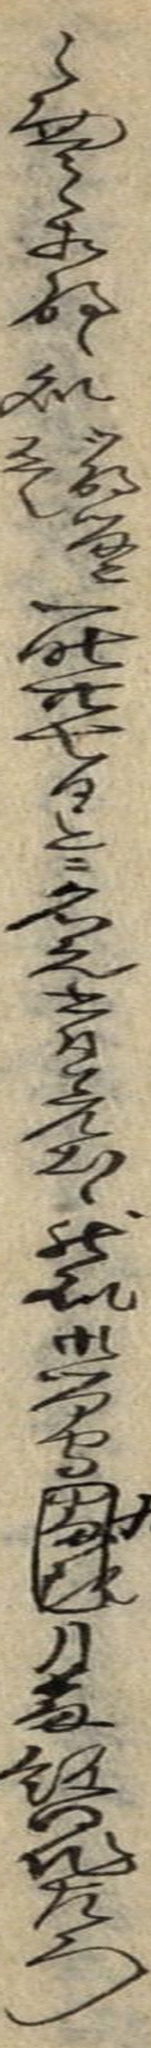之面々へ相触候処御触留に有之一昨廿七日迄に名元書付差出候然処御留守居番頭月番飯田作左衛門
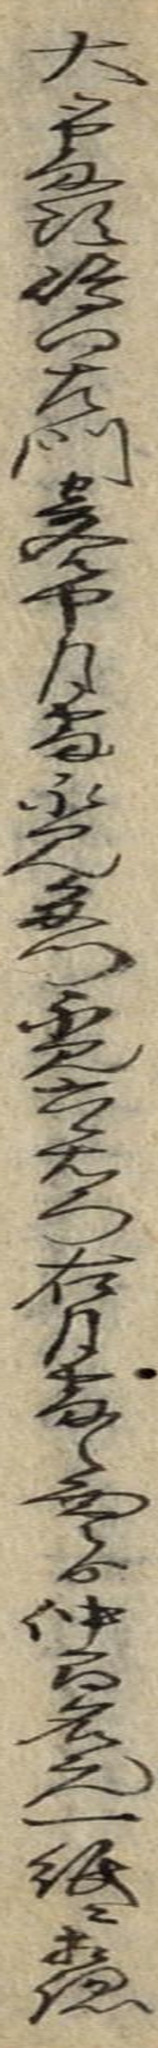大御番頭嶋田左門寄合中月番永見多門永見六郎右衛門右月番之面々ゟ仲間名元一紙に相認
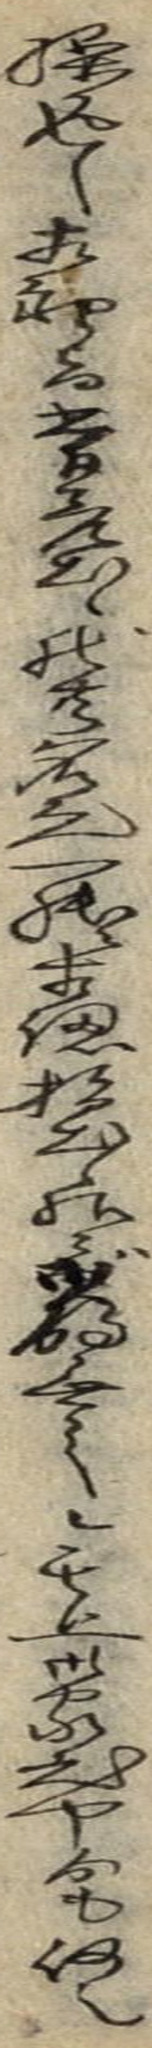繰返し相勤候旨書付差出候然共名元一紙に相認指出候様には御触無之候其上御家老中ゟも何之
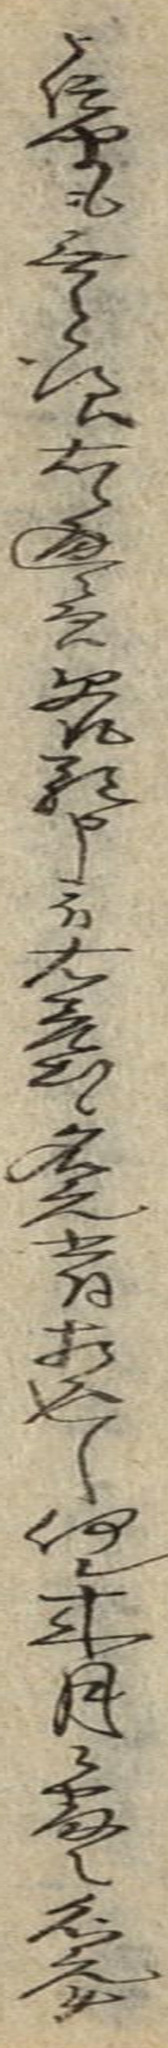被仰聞も無之候得は右之通に而は受取難申候に付右差出候名元書付相返之何れ来月々番之名元斗
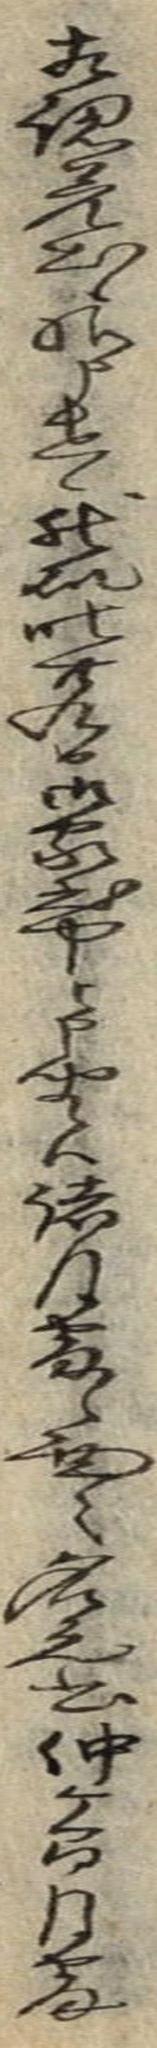相認差出候様申遣候然処昨廿九日御家老中被申聞候は諸月番之面々名元書仲ヶ間月番
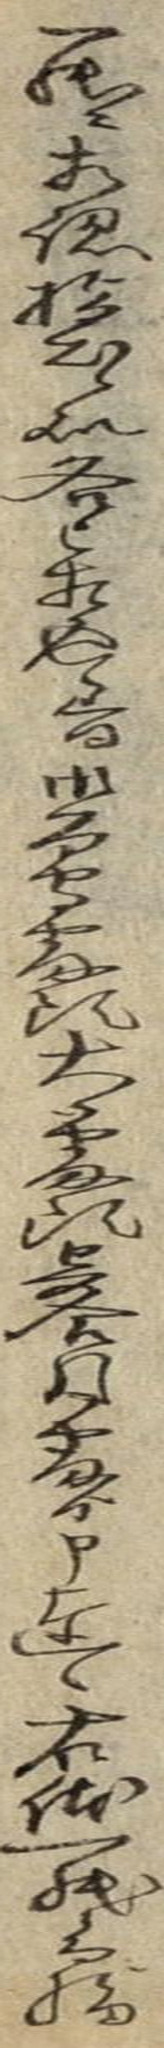一紙に相認指出候処各被相返候旨御留守番頭大御番頭寄合月番ゟ申達候右体一紙に而指
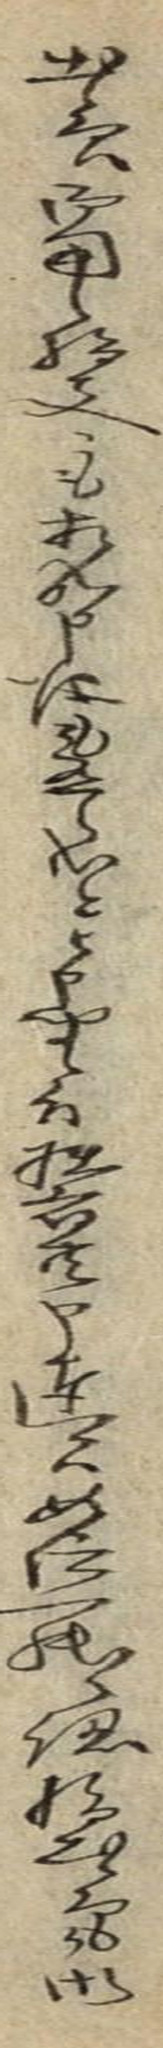出候而は御用之指支にも相成申儀も有之候哉と被申聞候に付拙者共申達候は如仰一紙に認指出候而も御
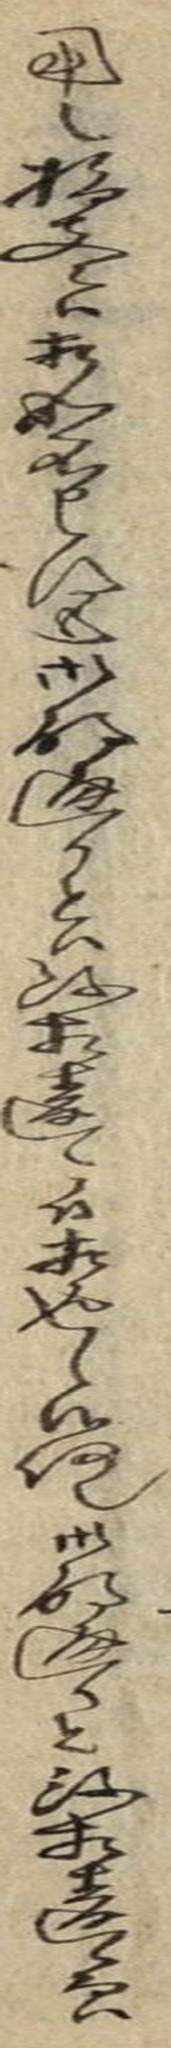用之指支には相成不申候得共御触通とは致相違候に付相返之候何れ御触通りと致相違候而は
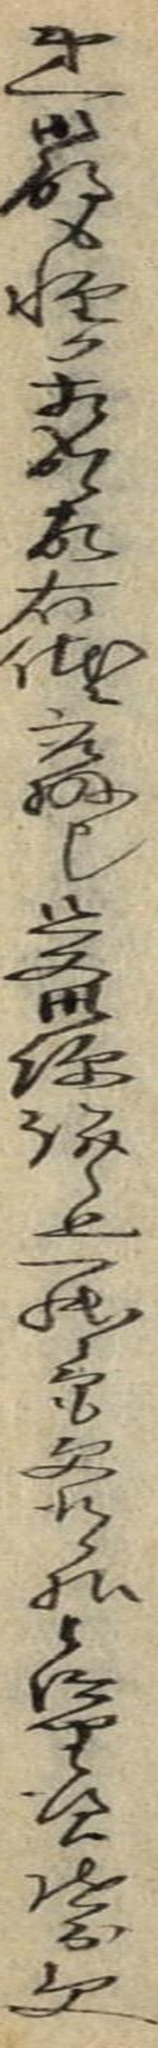第一御触も軽く相成候故右体に取扱申候且又御評議之上一紙に而も受取候様被仰聞候得は随分受
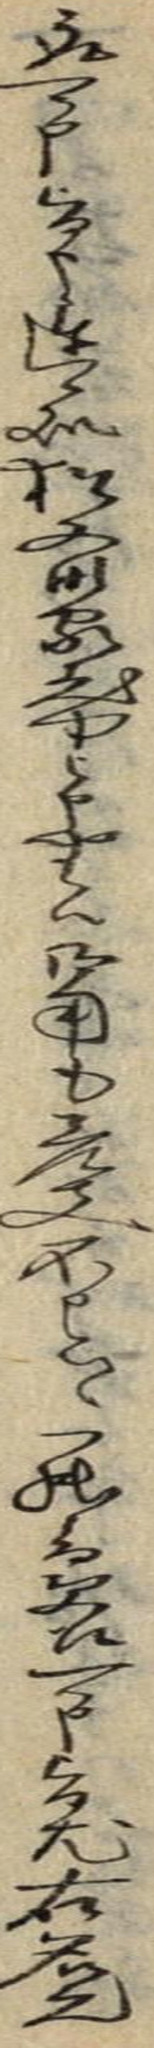取可申旨申達候処猶又御家老中被申聞候は御用も差支不申候はゝ一紙に而受取可申旨尤右名元
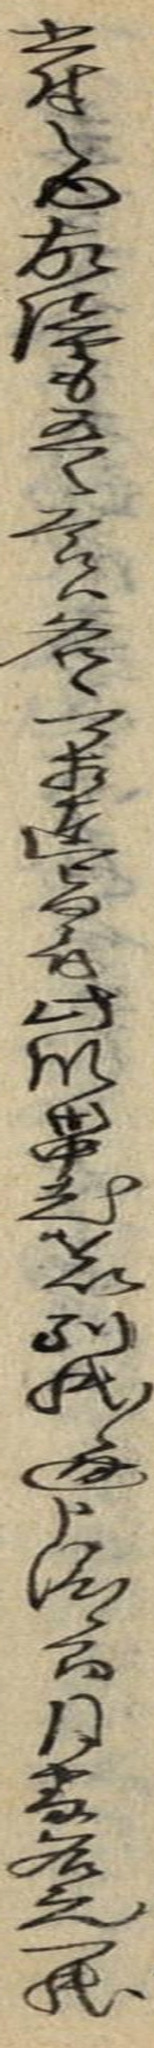書付之内故障も有之候節は各へ可相達旨に付此段御中老を以別紙之通申渡候間月番名元一紙
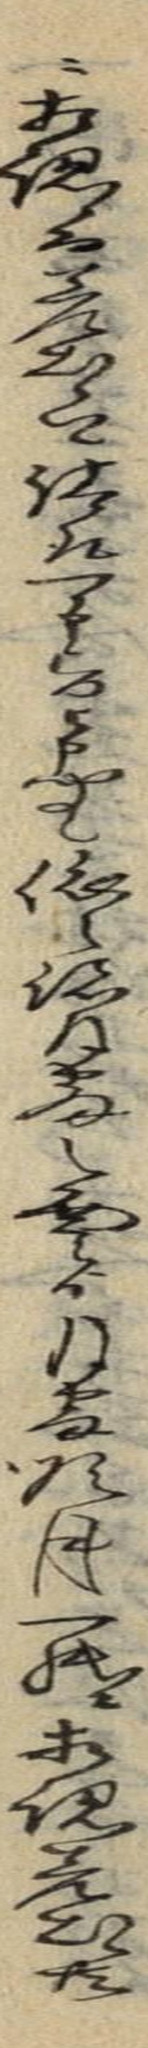に相認候而差出候はゝ請取可申旨被申聞候依之諸月番之面々ゟ月番順月一紙に相認差出候共
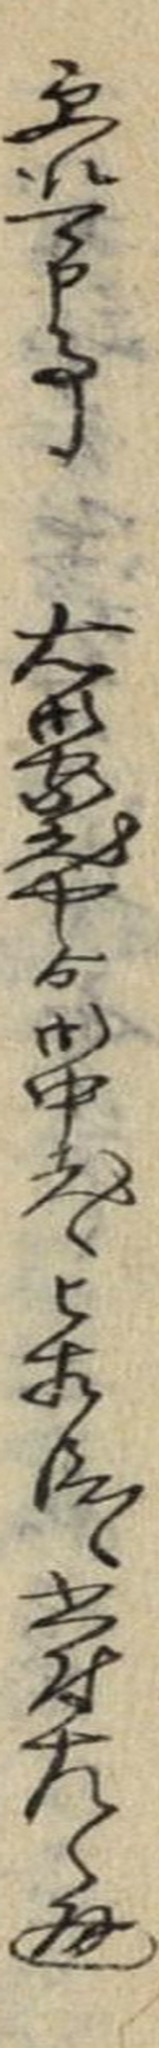受取可申候事右御家老中ゟ御中老へ被相渡候書付左之通
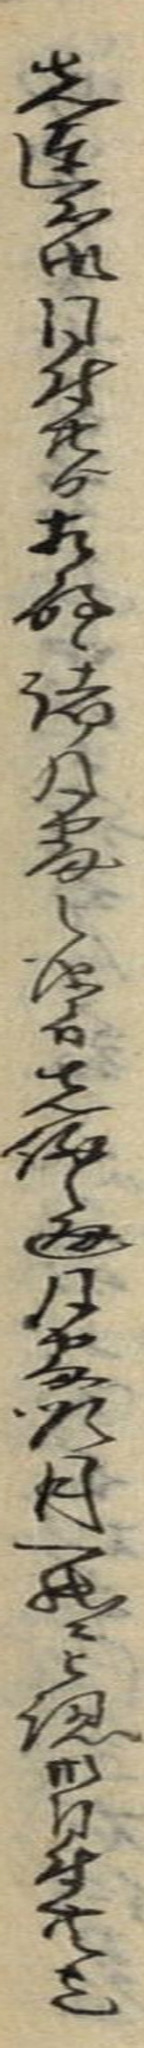先達而御目付共ゟ相触候諸月番之儀に付先例之通月番順月一紙に被認御目付共迄
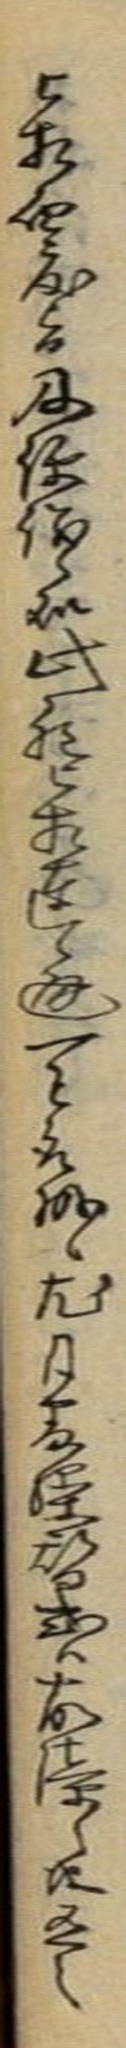被相届被成旨及評議候処此程被相達候通可被取扱候尤月番繰替或は故障之儀有之
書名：蒐輯之部
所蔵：福井県文書館 Fukui Prefectural Archives
